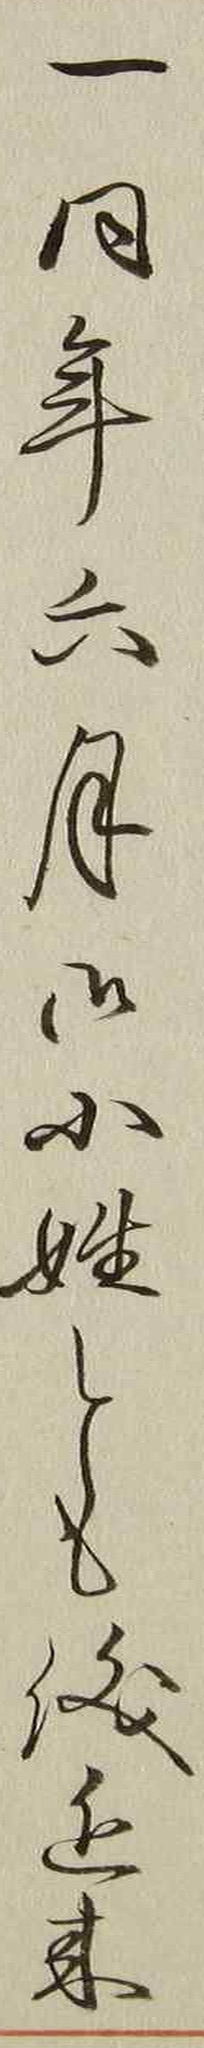一同年六月御小姓とも儀近来
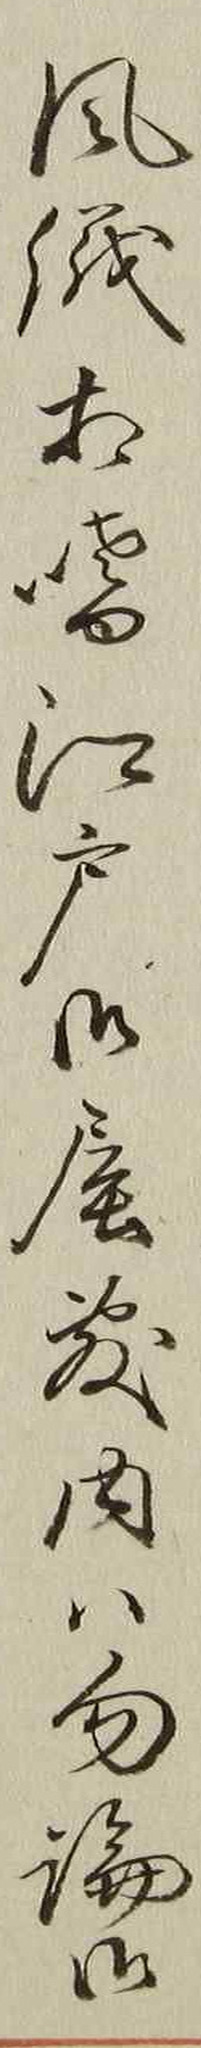風儀相嗜江戸御屋敷内ハ勿論御
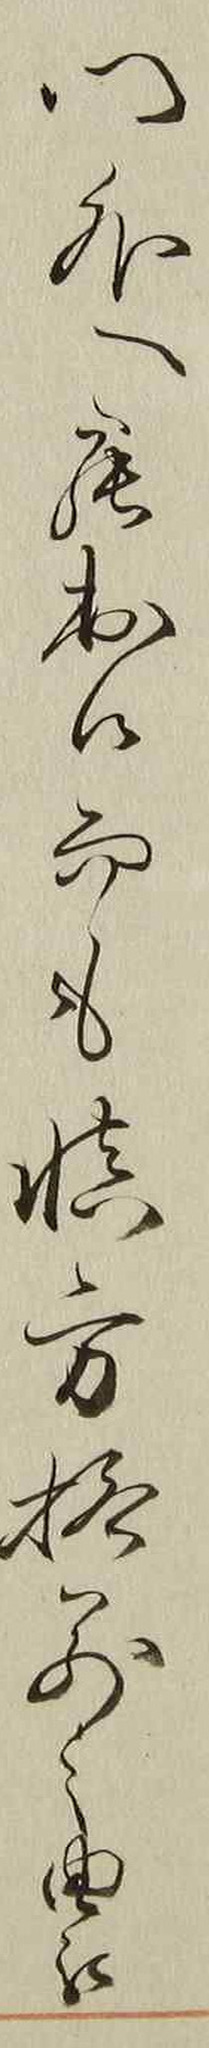門外へ罷出候而も慎方格別之由被
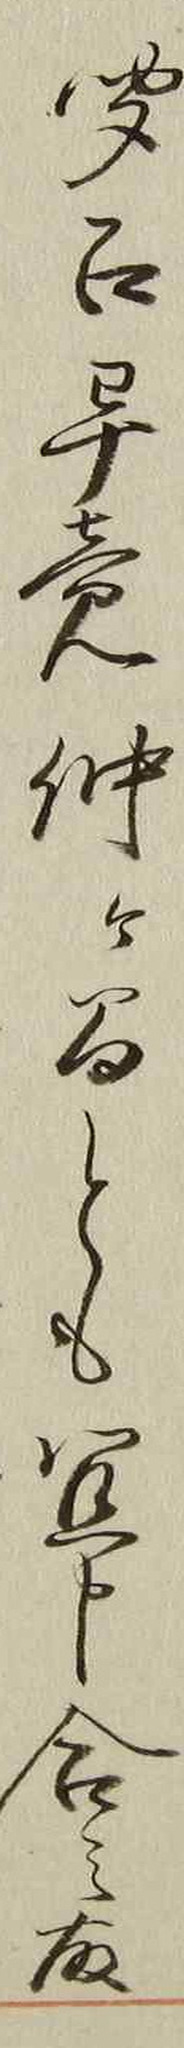聞召畢竟仲ヶ間とも宜申合之故
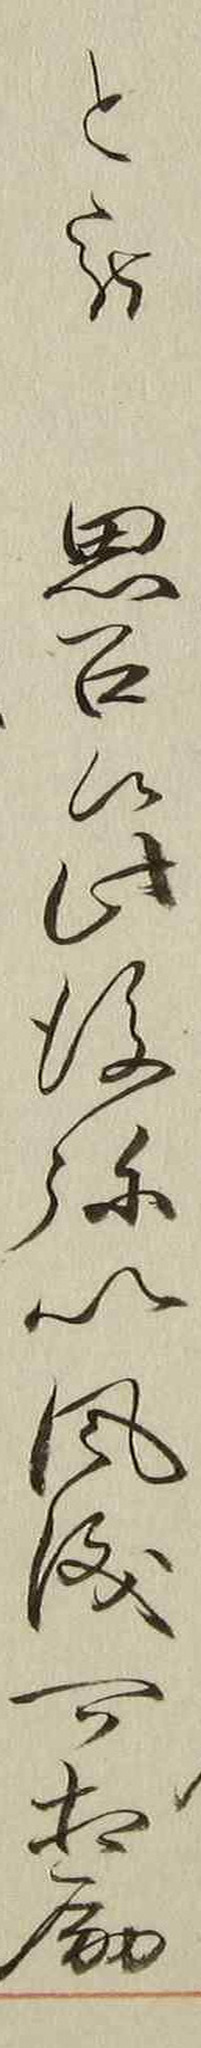と被思召候此後弥風儀可相励
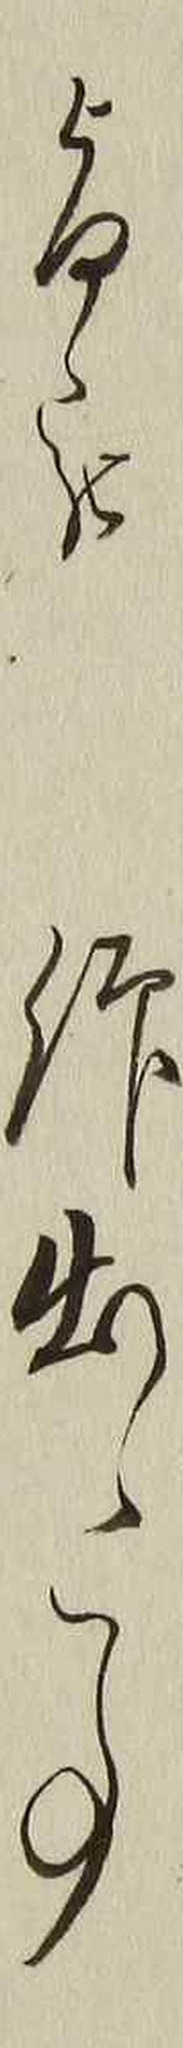旨被仰出候事
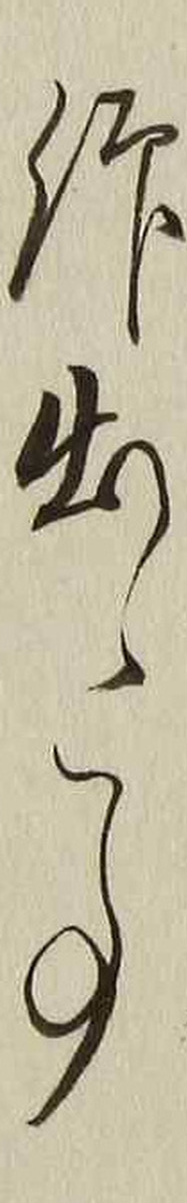仰出候事
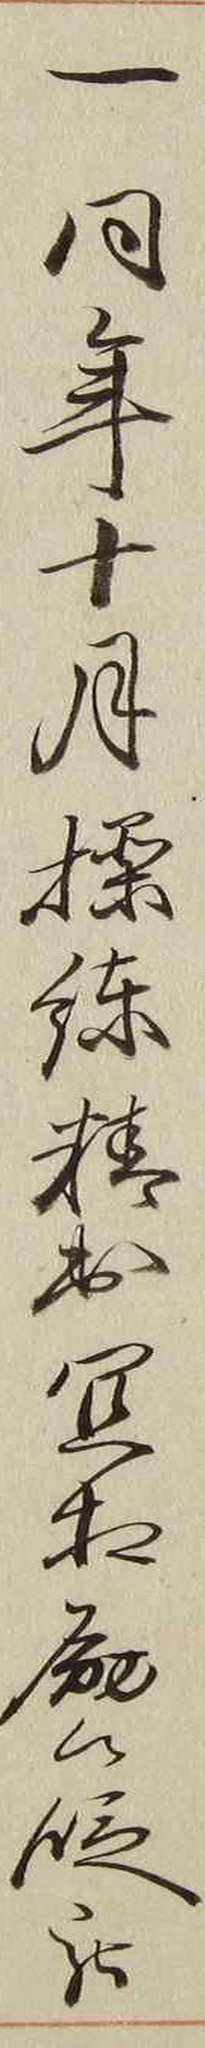一同年十月操練精出宜相励候段被
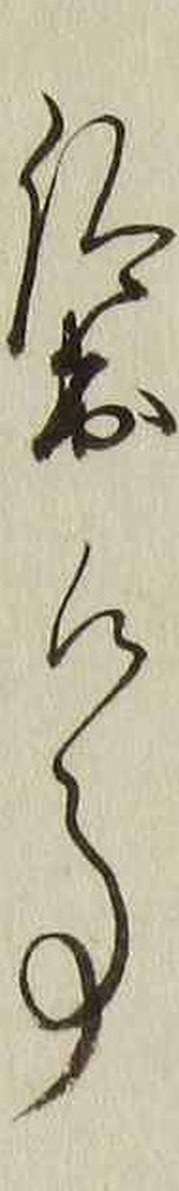仰出候事
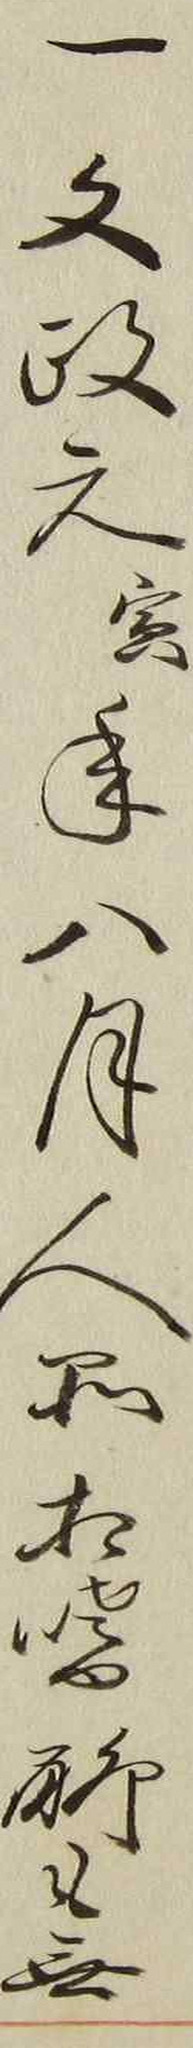一文政元寅年八月人品相嗜聊も無
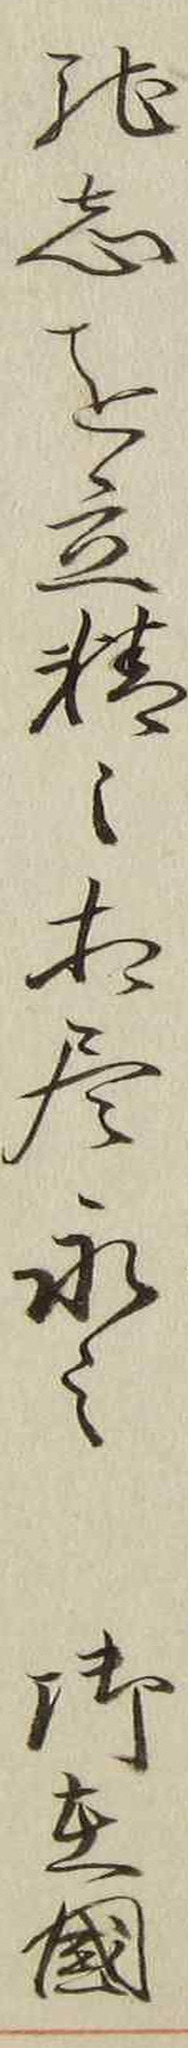駄四志を立精々相尽永之御在国
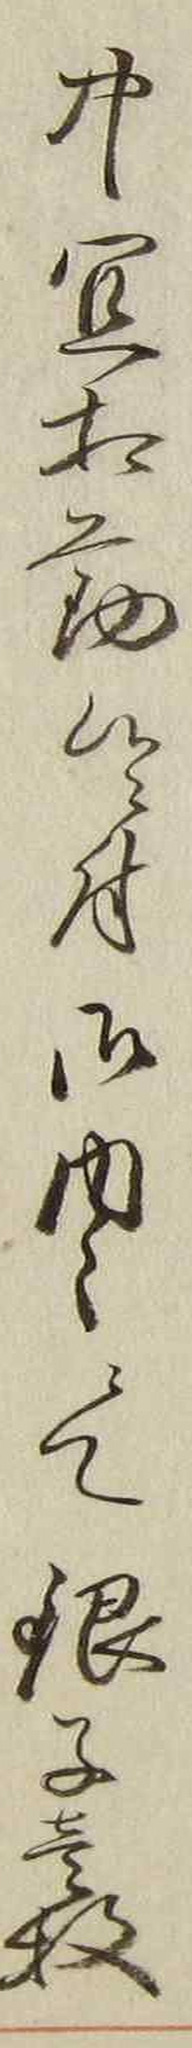中宜相勤候二付御内々ニて銀子壱枚
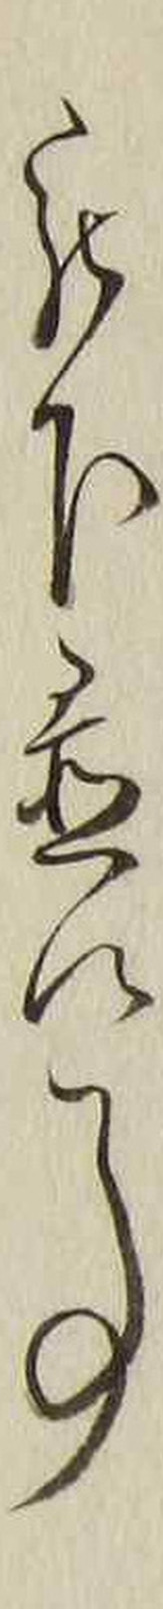被下置候事

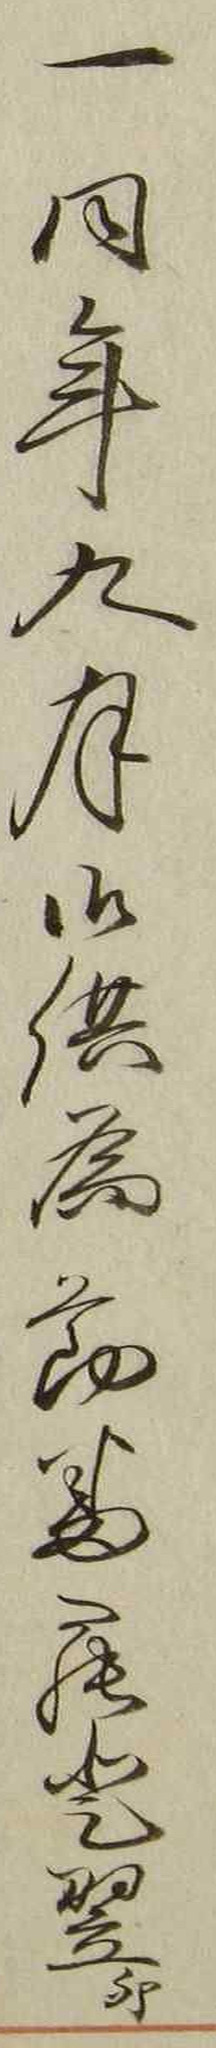一同年九月御供為勤番罷登翌
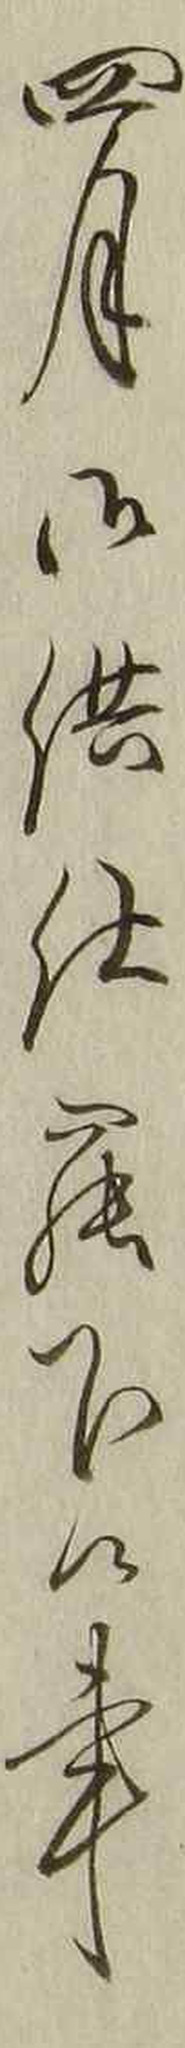四月御供仕罷下候事
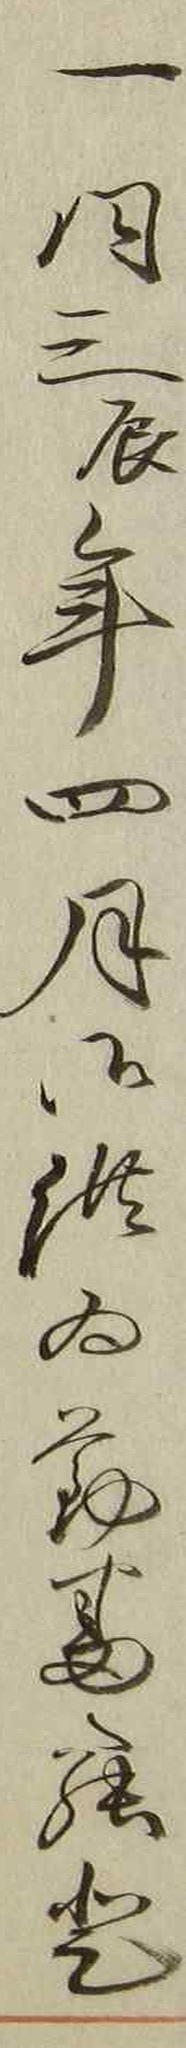一同三辰年四月御供為勤番罷登
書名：諸士系譜　巻之54　ほ之部1
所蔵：会津若松市立会津図書館
